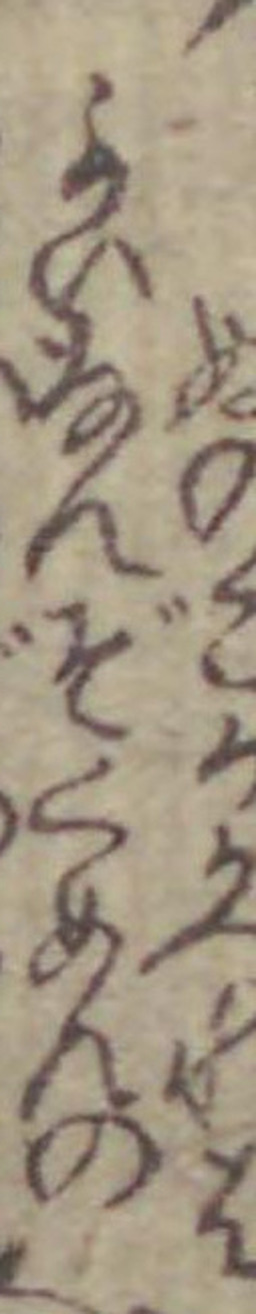よいなんぞくめんの
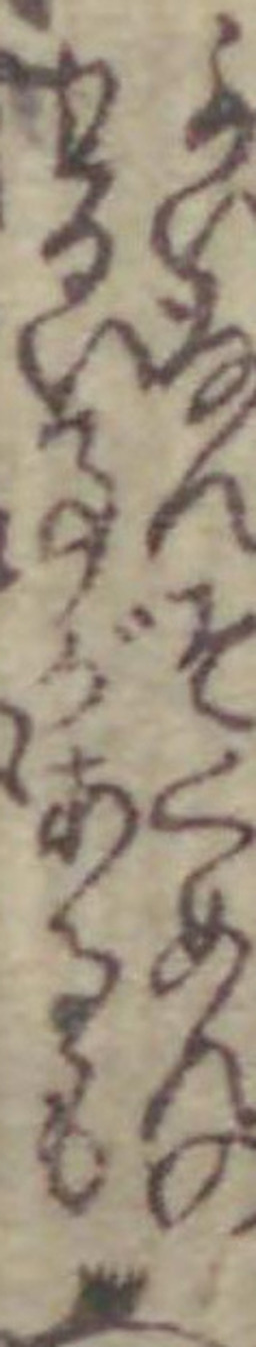わるい事があるも
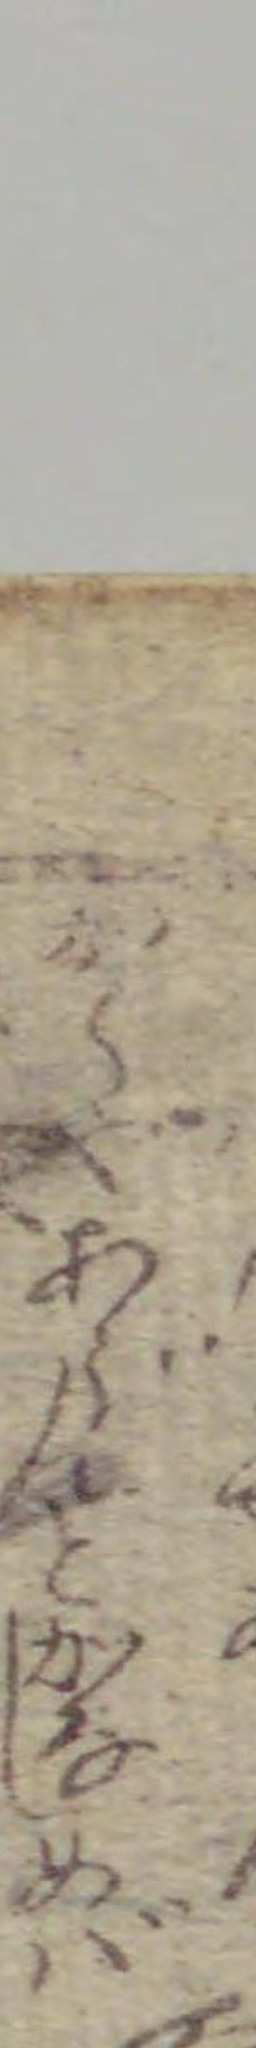かくやあらんとかなしめば
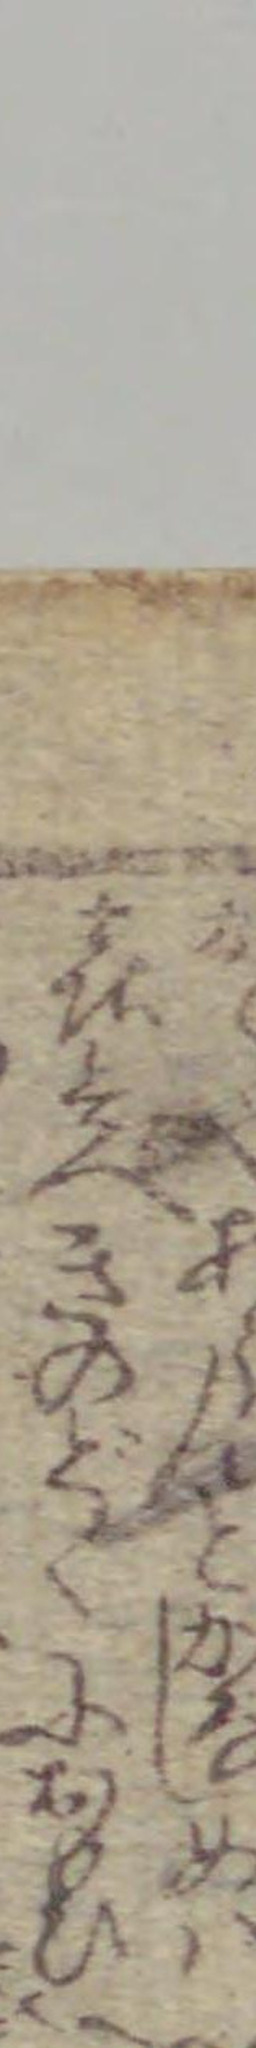きのどくにおもひ
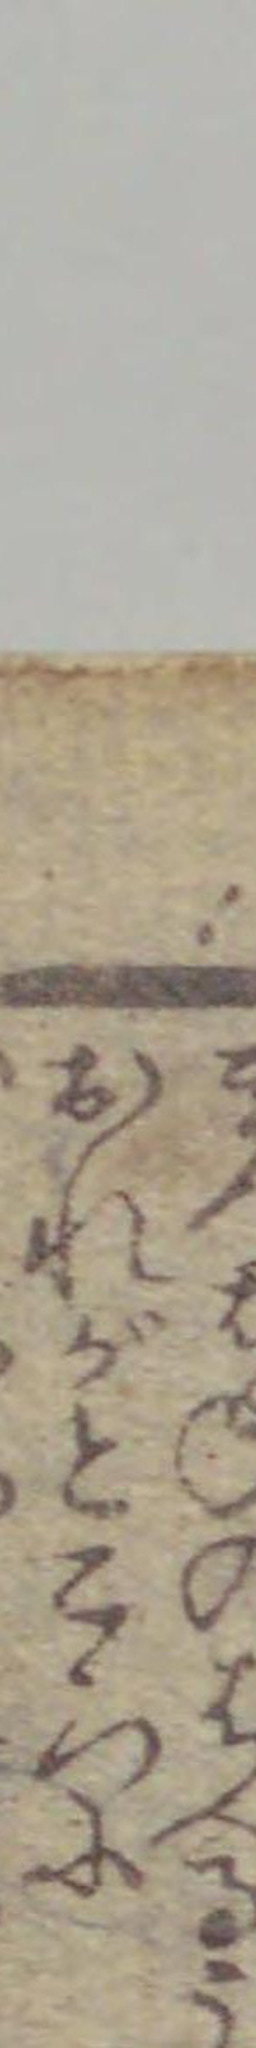おれがところに
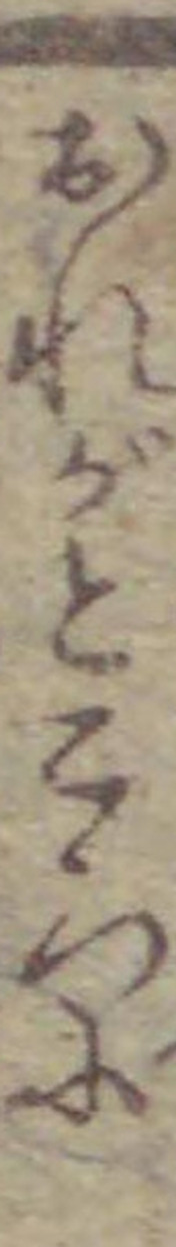おれがところに
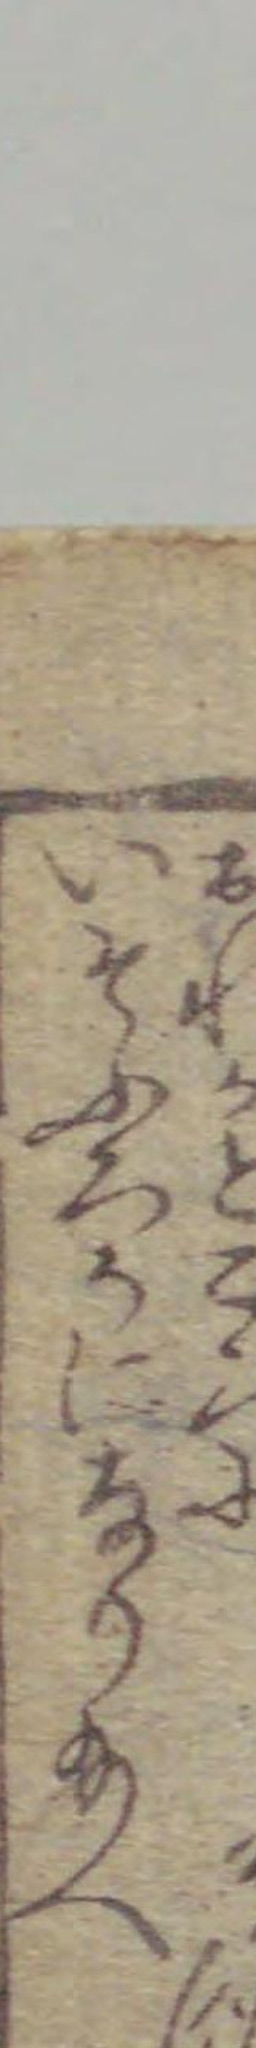いそふろうになり給へ
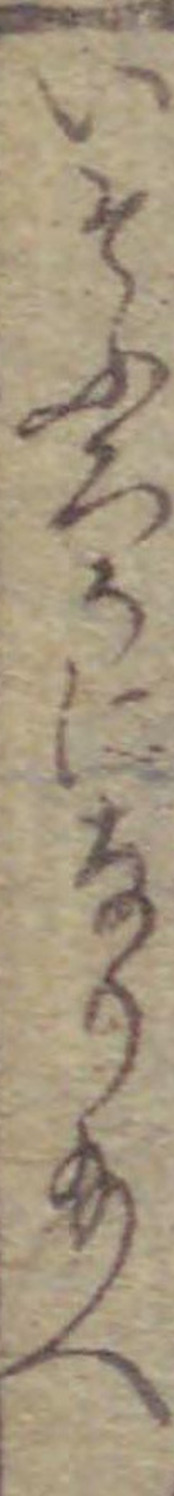いそふろうになり給へ

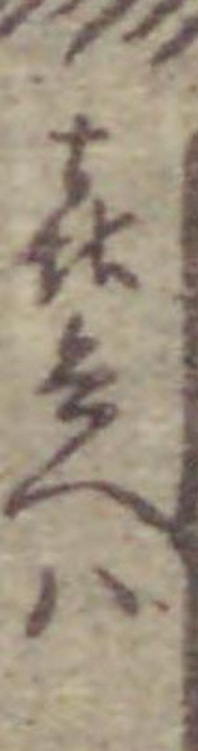喜兵へは
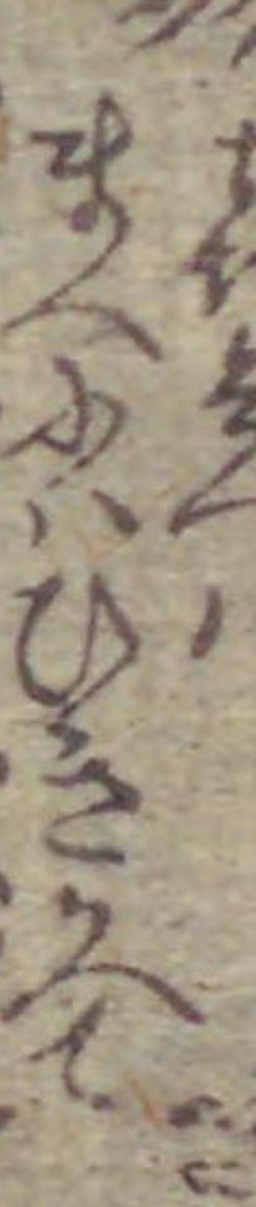まへにはひきかへて
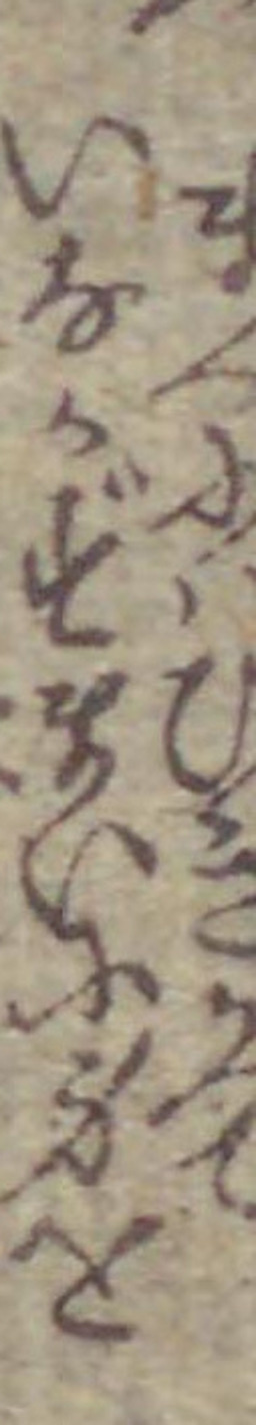いなかずまいに身を
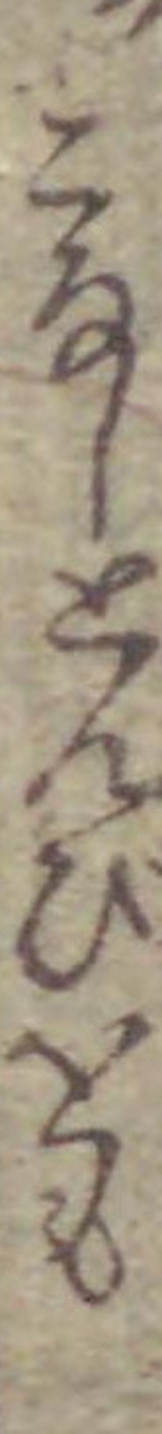こなしとんびをも
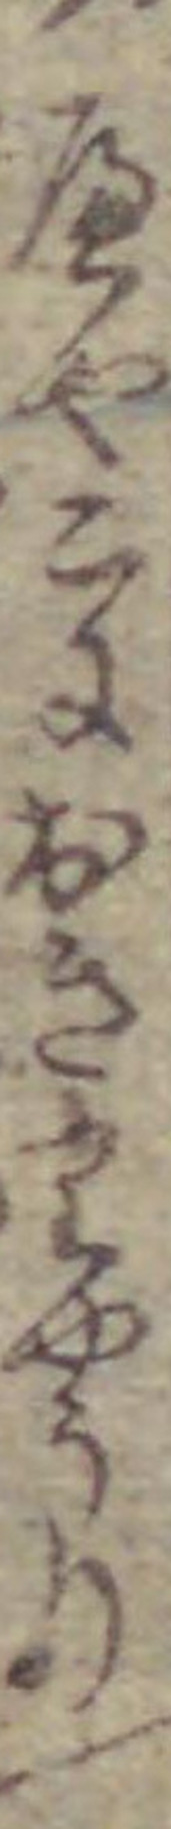へやこにおきりやうり
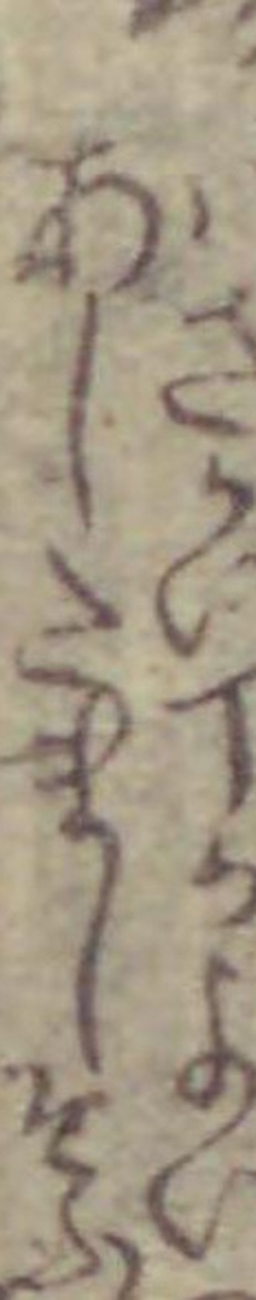あしたましそふへ
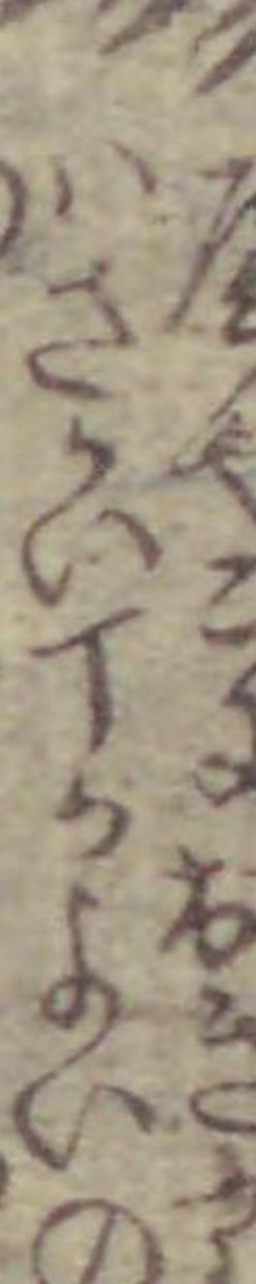はさかい丁かよいの
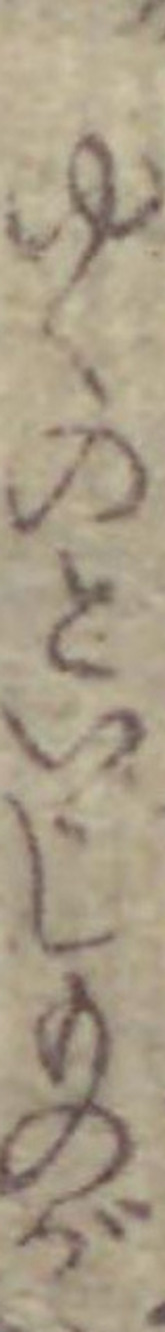ゆくのといゝしものが
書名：親父布子鳶握 3巻
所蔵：国立国会図書館 National Diet Library, JAPAN
